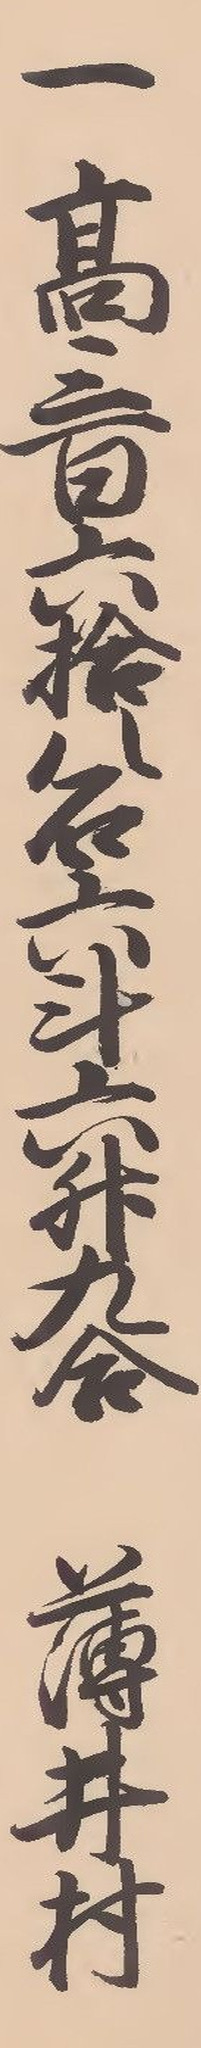一高三百六拾八石六斗六升九合薄井村
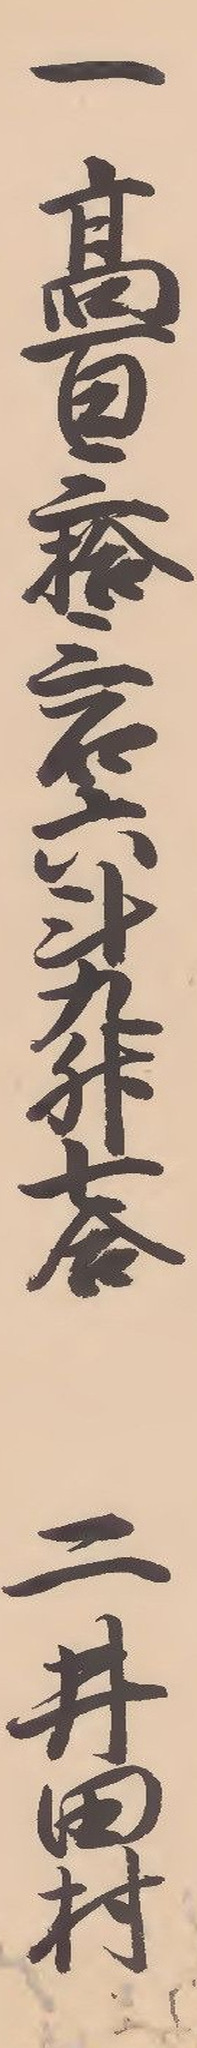一高百三拾三石六斗九升七合二井田村
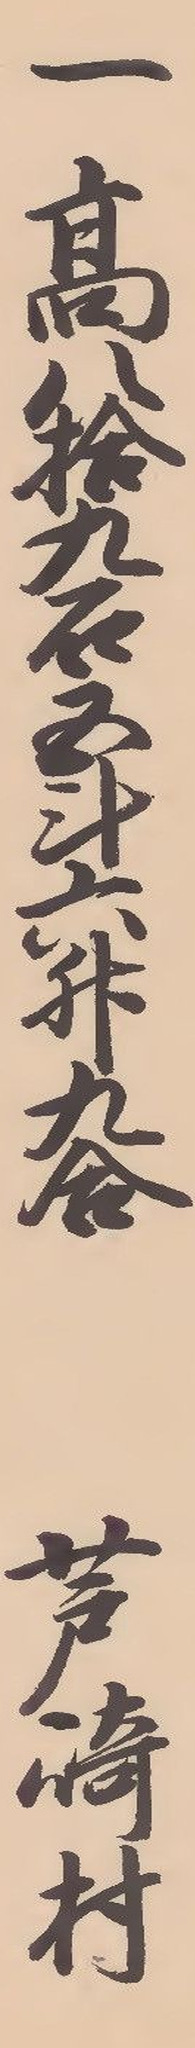一高八拾九石五斗六升九合芦崎村
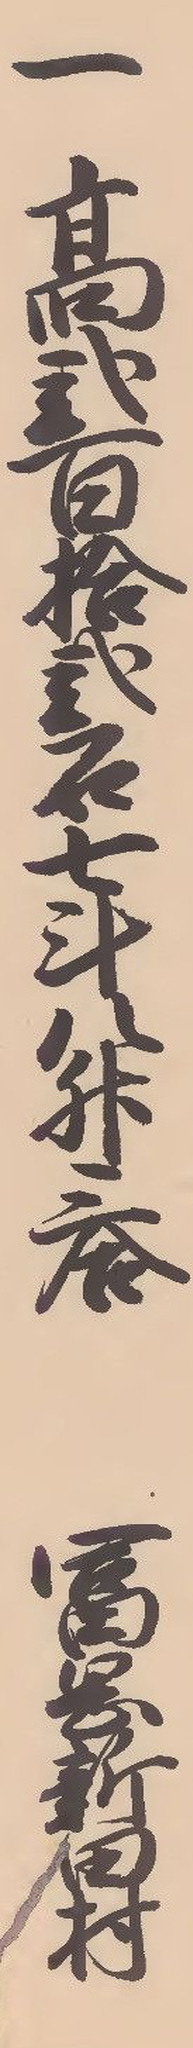一高弐百拾弐石七斗八升三合冨岡新田村

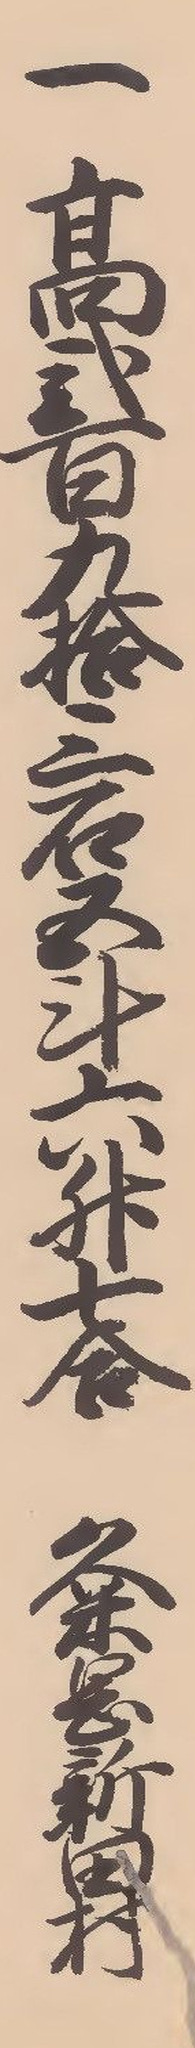一高弐百九拾三石五斗六升七合粂岡新田村
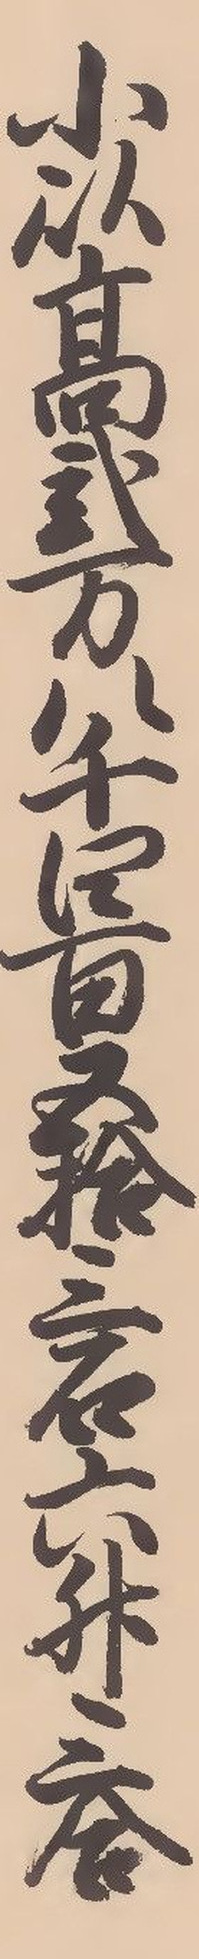小以高弐万八千四百五拾三石六升三合
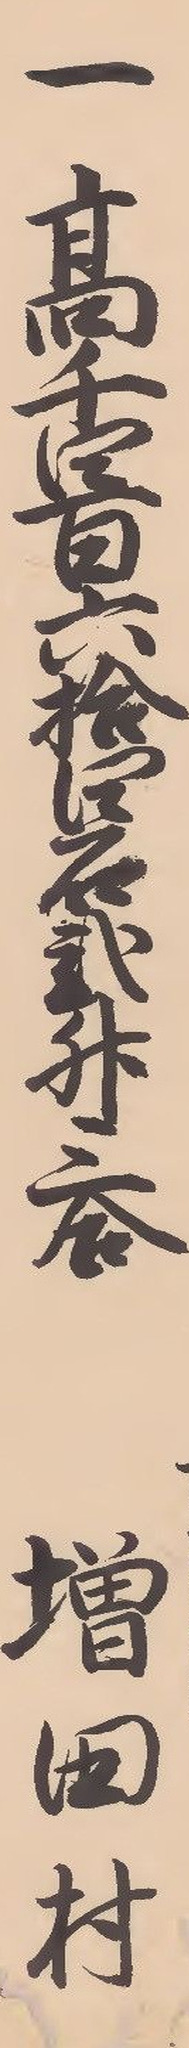一高千四百六拾四石弐升三合増田村
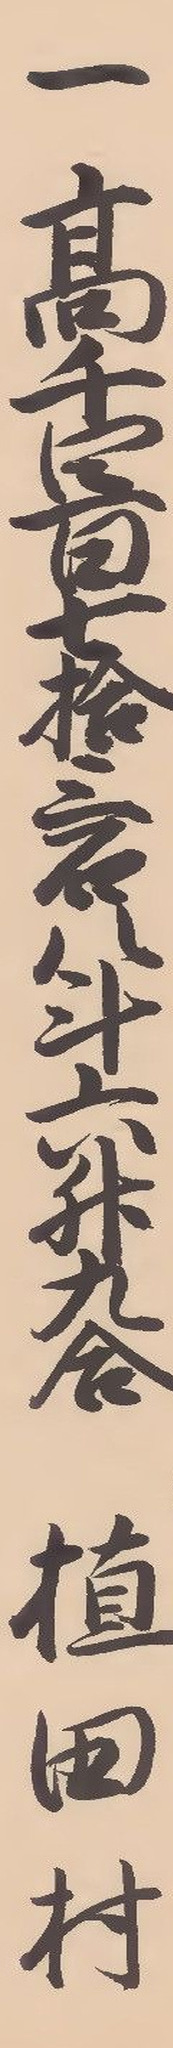一高千四百七拾三石八斗六升九合植田村
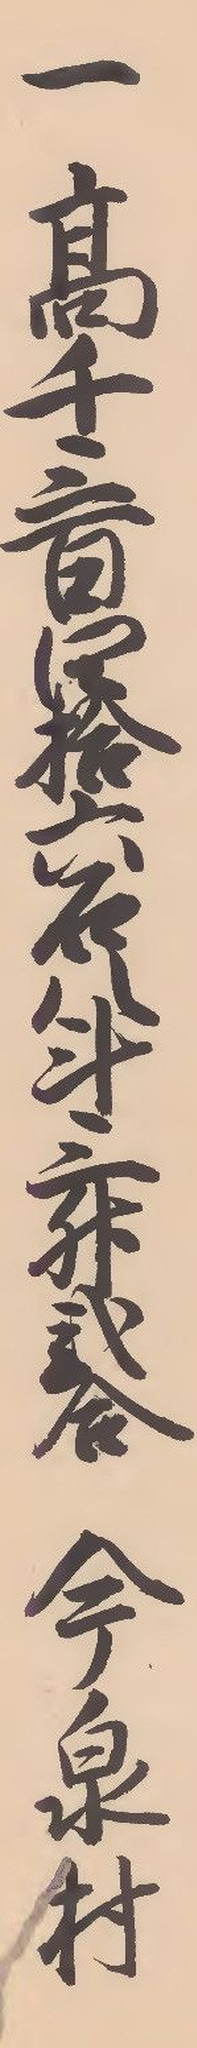一高千三百四拾六石八斗三升弐合今泉村

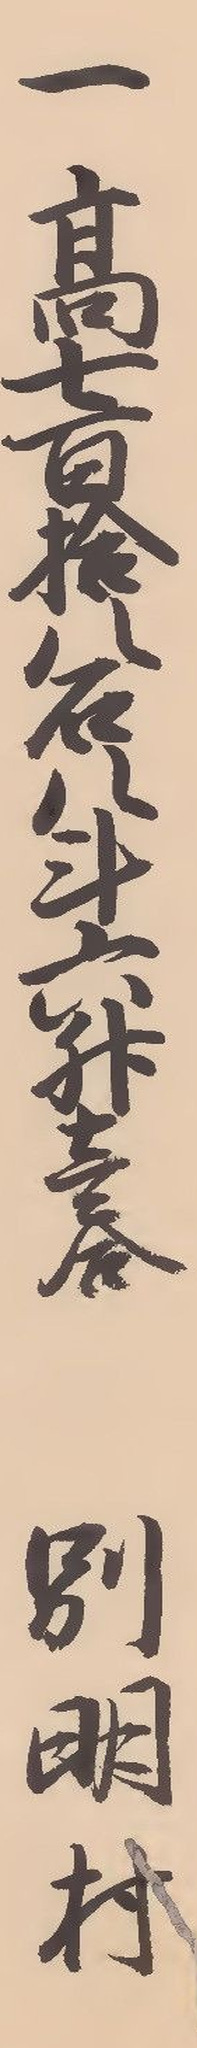一高七百拾八石八斗六升壱合別明村
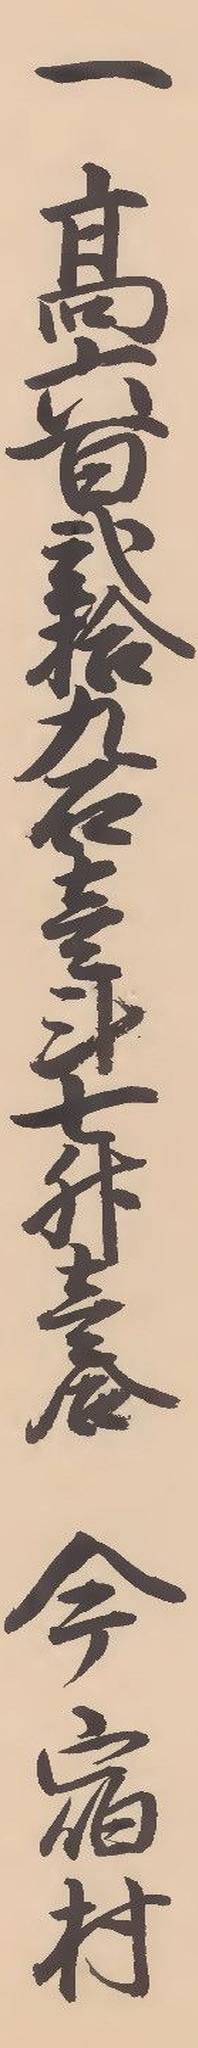一高六百弐拾九石壱斗七升壱合今宿村
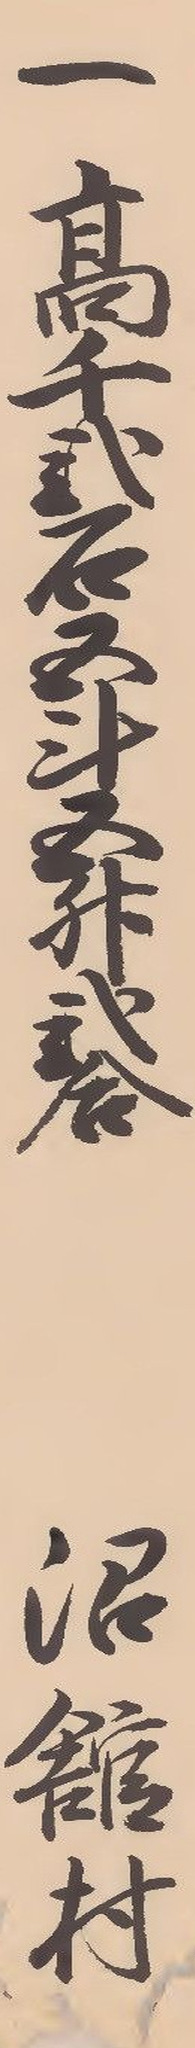一高千弐石五斗五升弐合沼館村
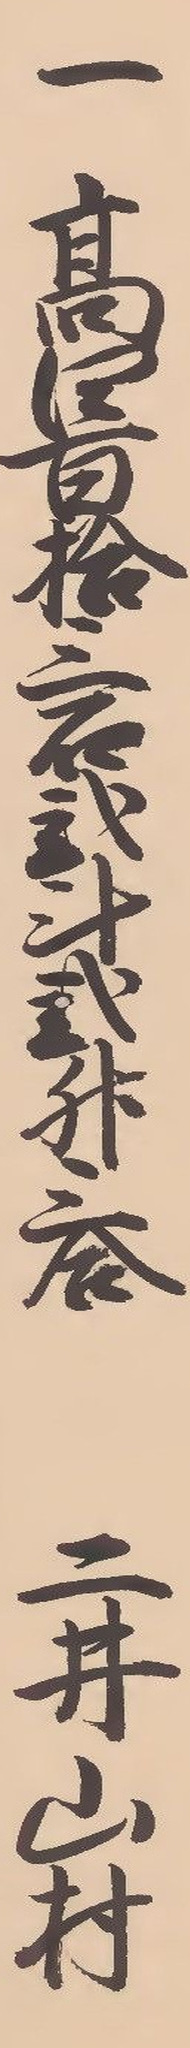一高四百拾三石弐斗弐升三合二井山村
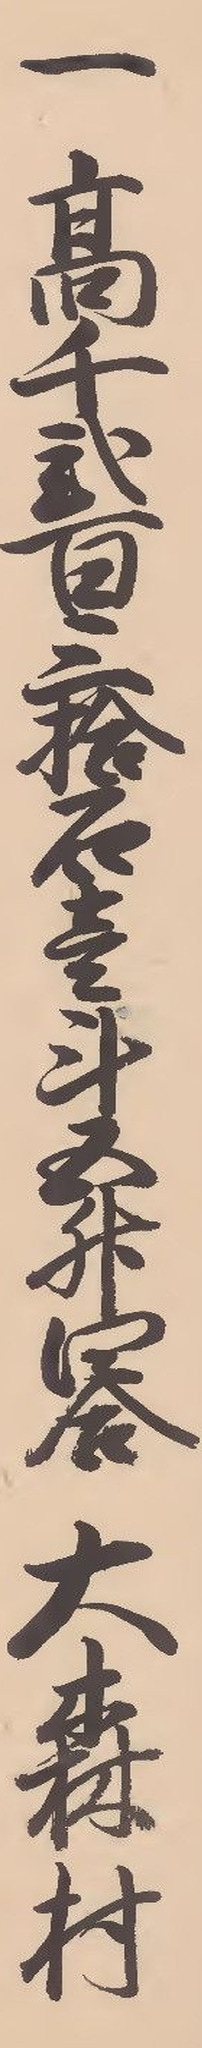一高千弐百三拾石壱斗五升四合大森村
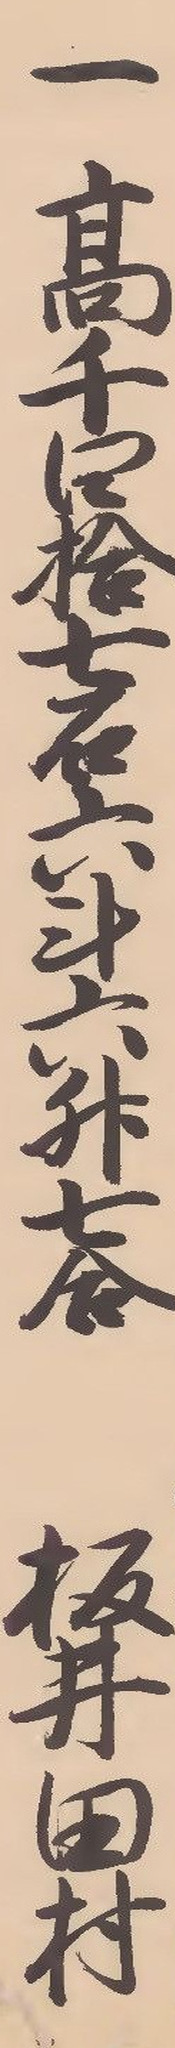一高千四拾七石六斗六升七合板井田村
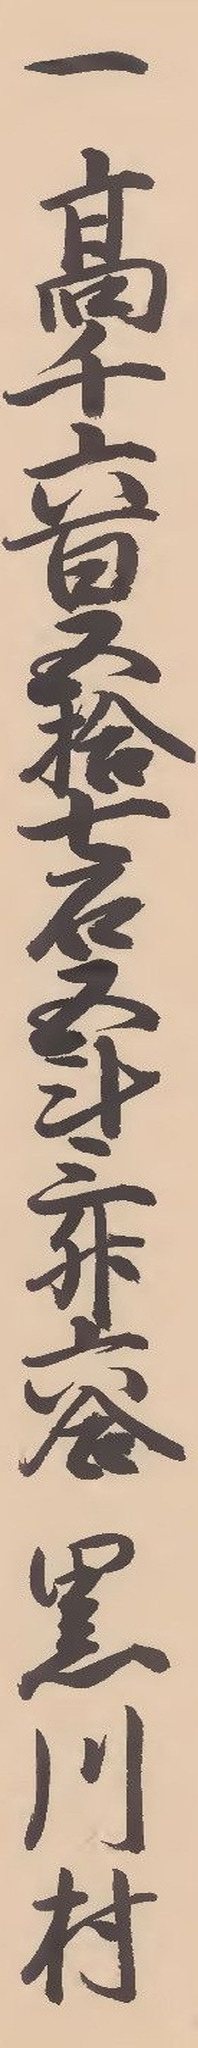一高千六百五拾七石五斗三升六合黒川村
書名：出羽国郷帳　５
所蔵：国立公文書館 National Archives of Japan
